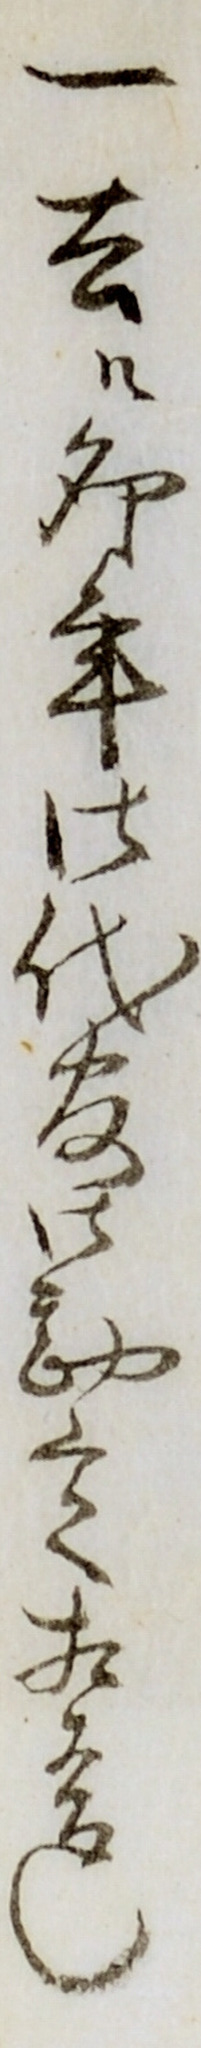一去ル卯年御代官御勘定相違
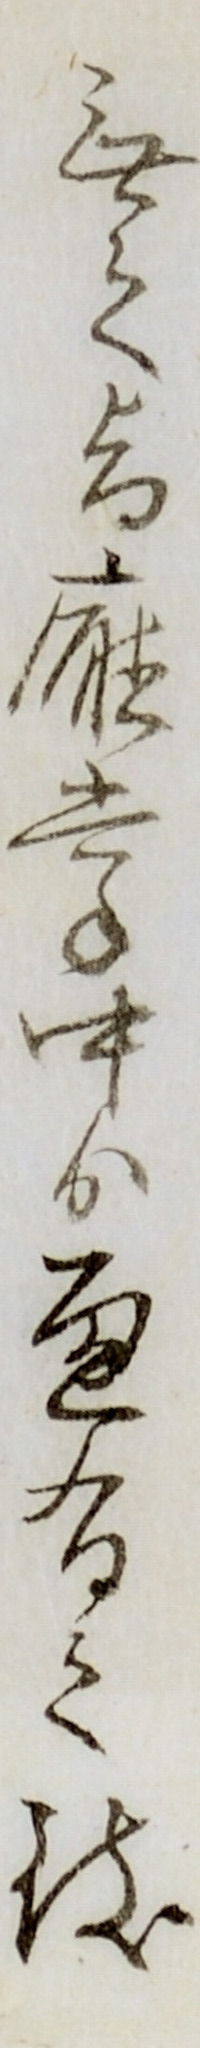無之旨庁掌中ゟ通有之致
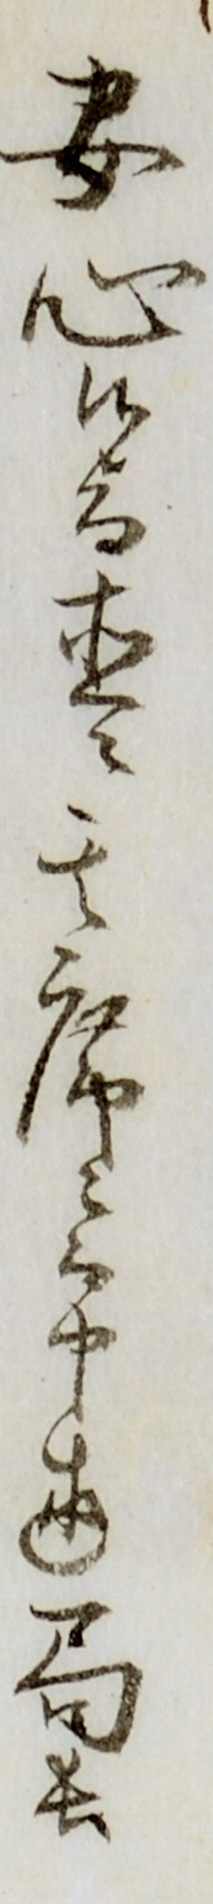安心候旨直に其席にて申述局長
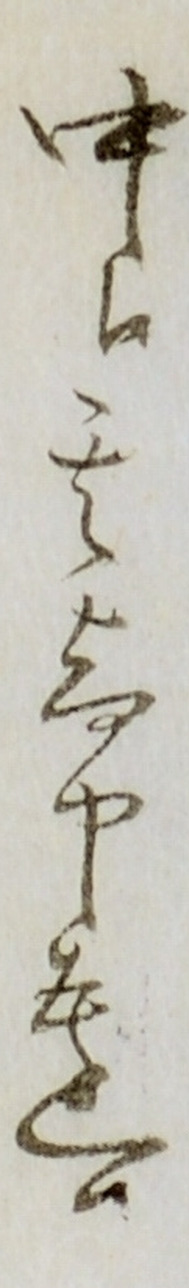中え其旨申達候
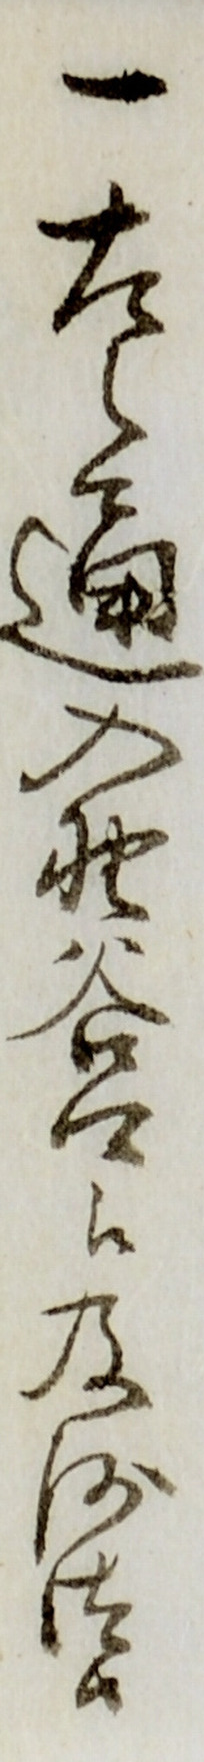一左之通入野谷郷え及沙汰候
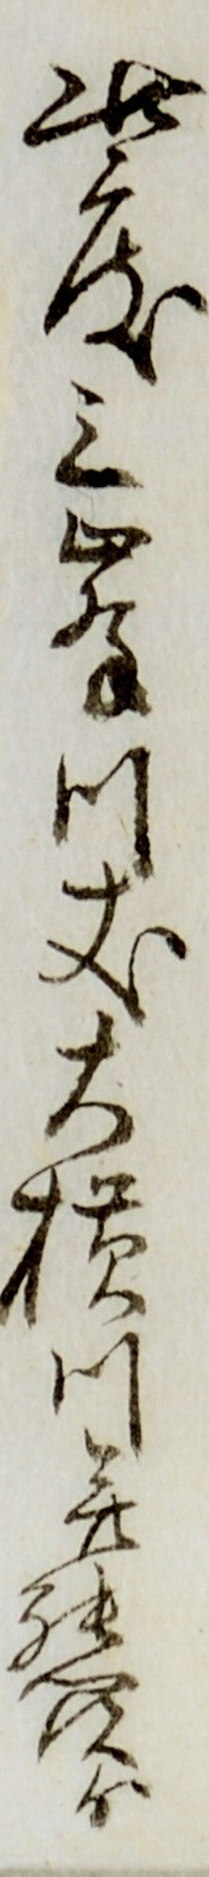此度三峯川丈大横川幷熊沢ゟ
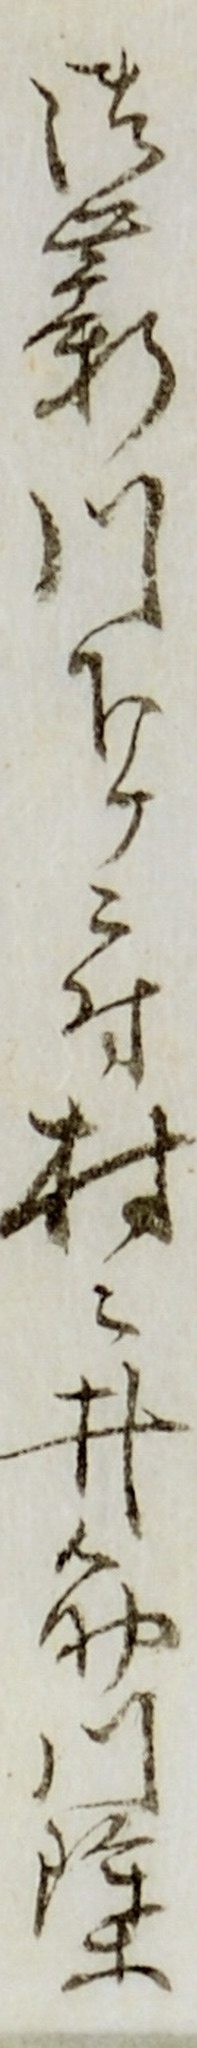御薪川下ヶに付村々井筋川除等
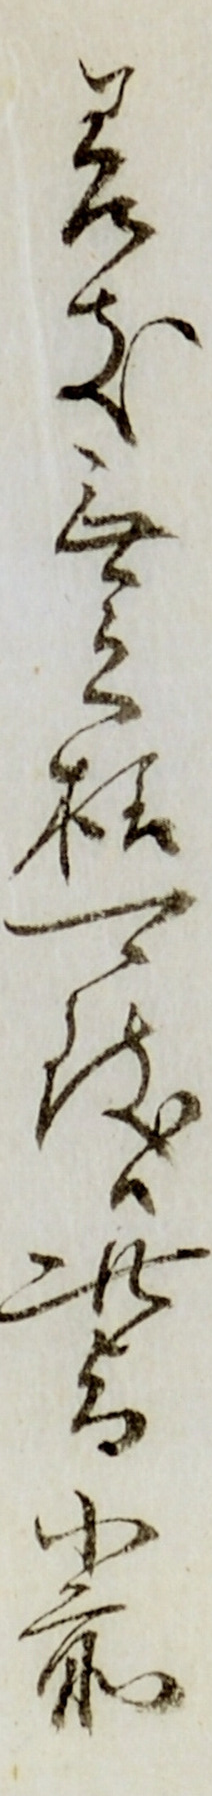差支無之様可致候此旨小前
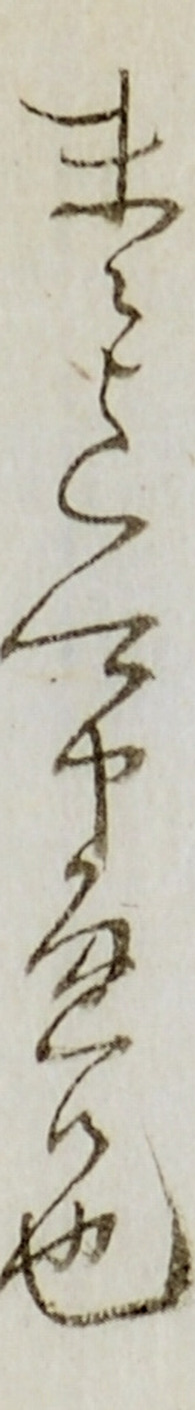末々迄可申通候也
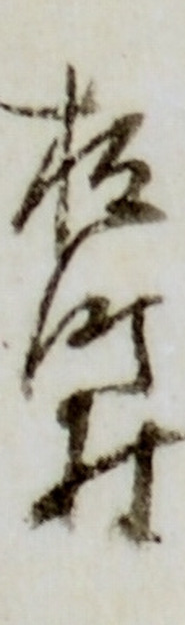板町村

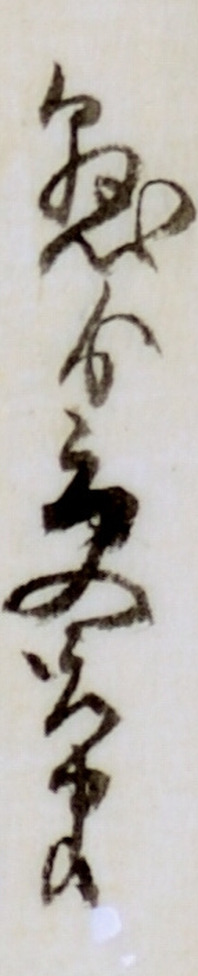懸ゟ受取申候
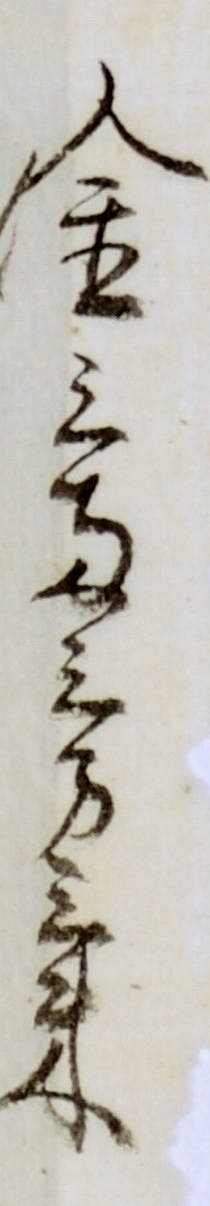金三両三分三朱
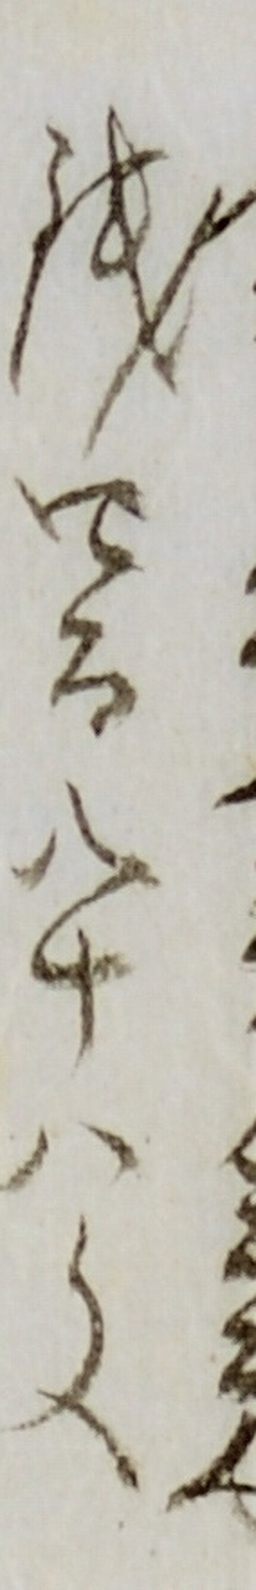銭四百八十八文
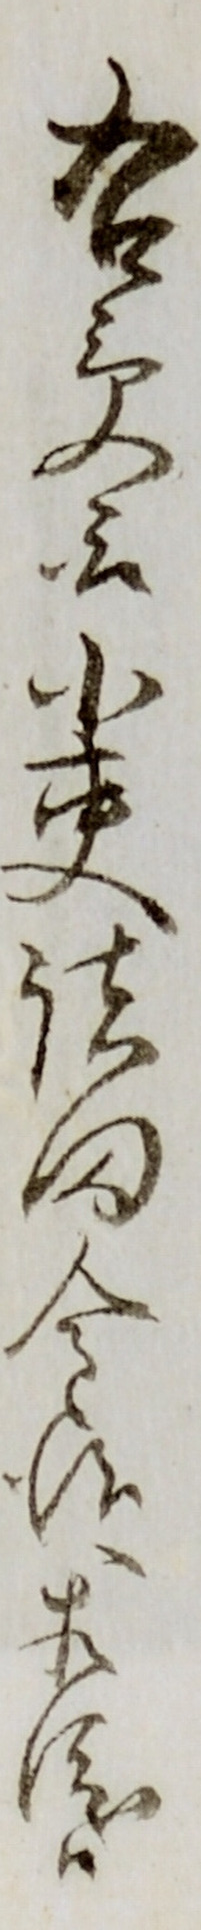右受取小吏諸田金治へ相渡候
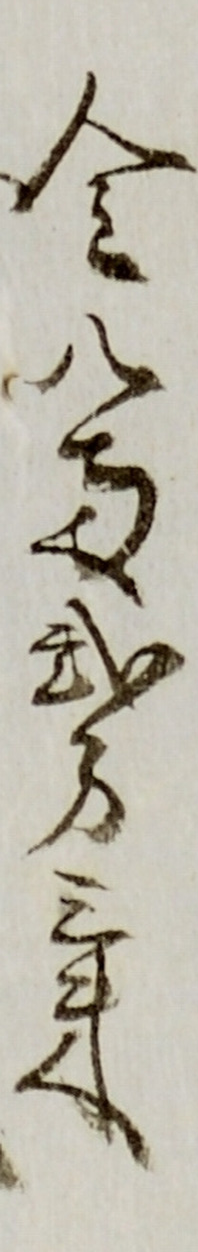金八両弐分三朱
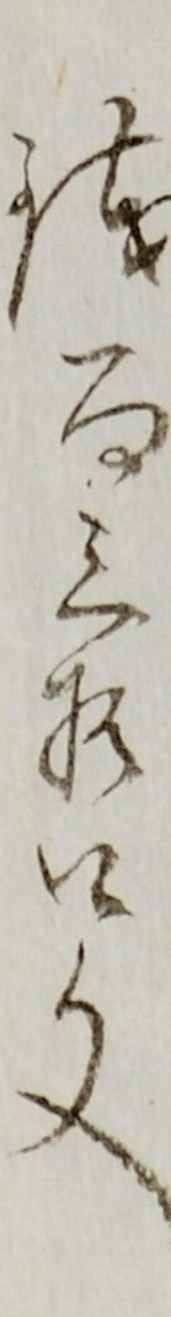銭百三十四文
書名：山林方諸事御用留
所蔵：伊那市立高遠町図書館・合同会社AMANE
